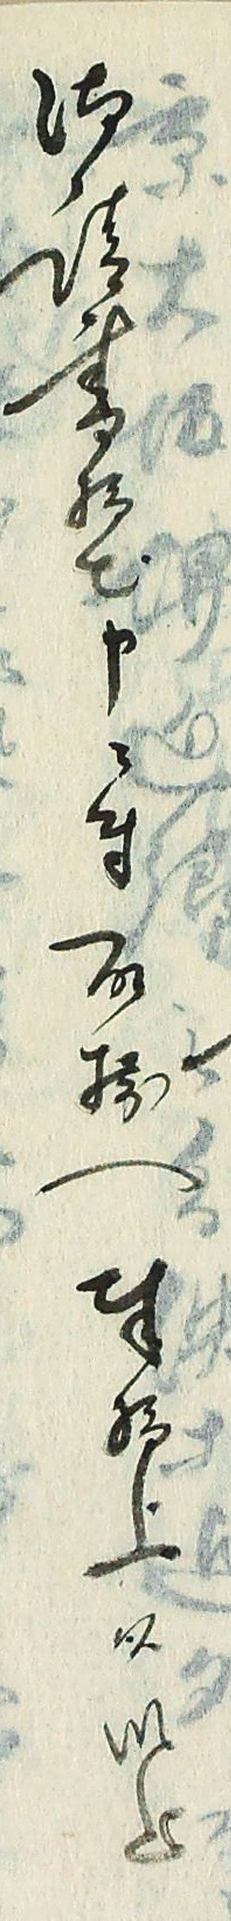御請書指出申に付取揃へ奉指上候以上
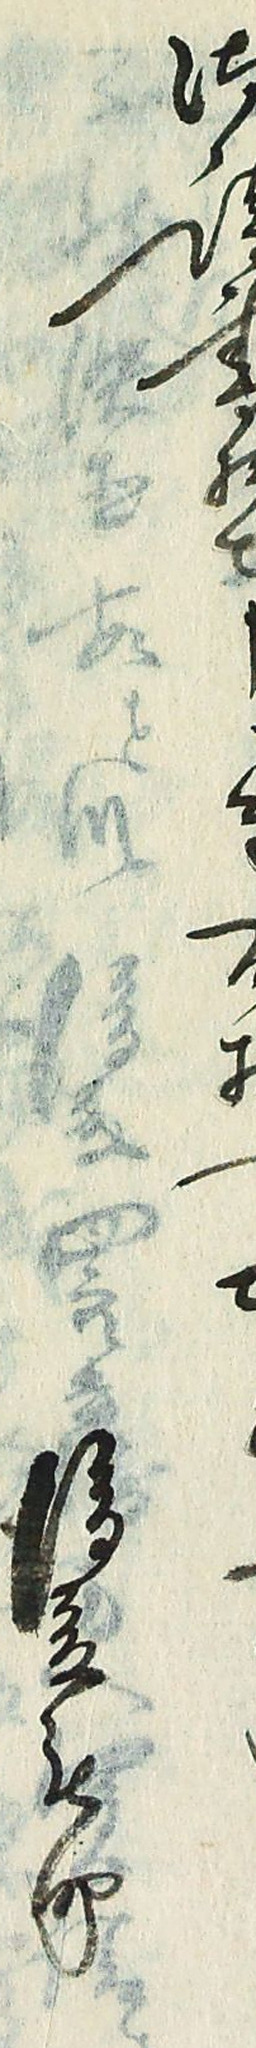後藤庄助
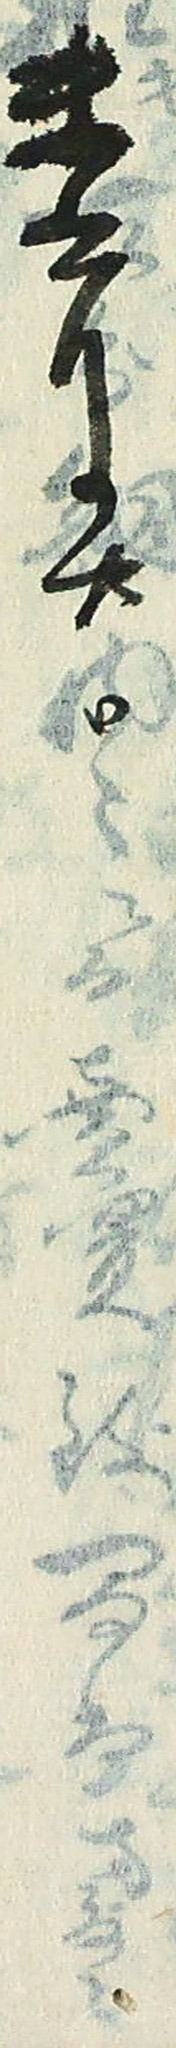未六月廿日
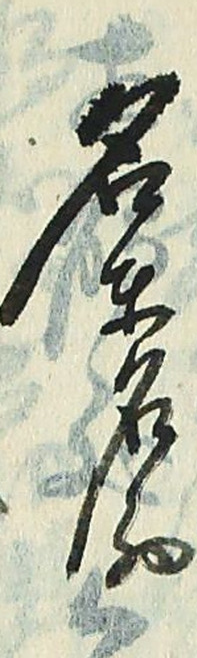名東名西
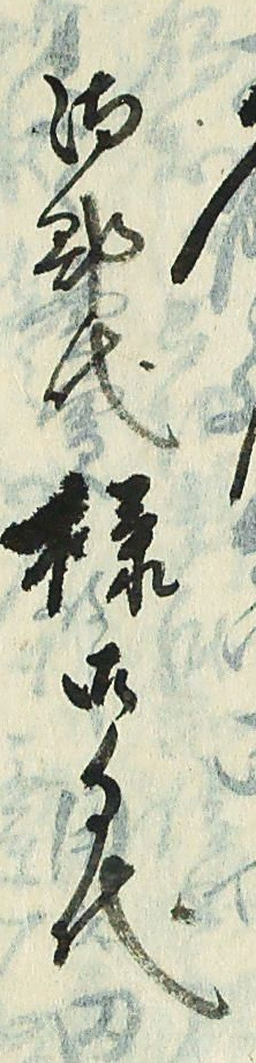御郡代様御手代
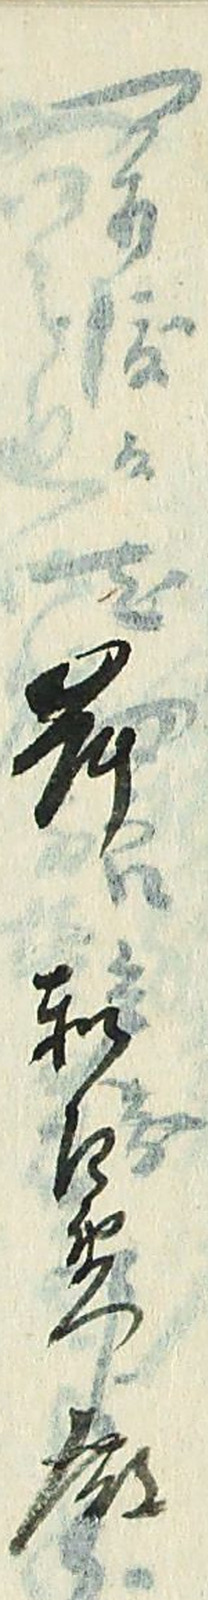岸和左衛門殿
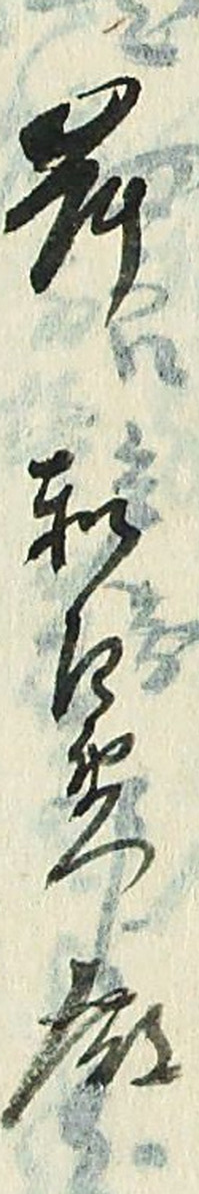岸和左衛門殿
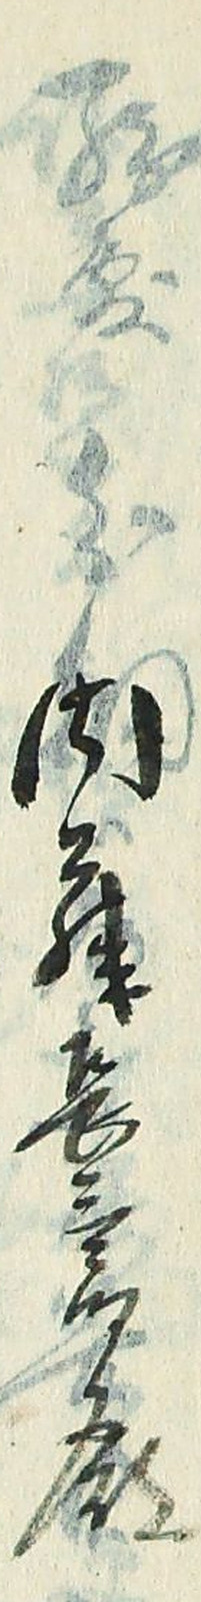内藤長三郎殿
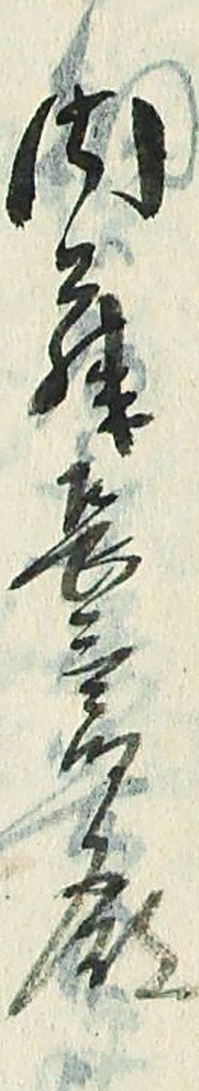内藤長三郎殿
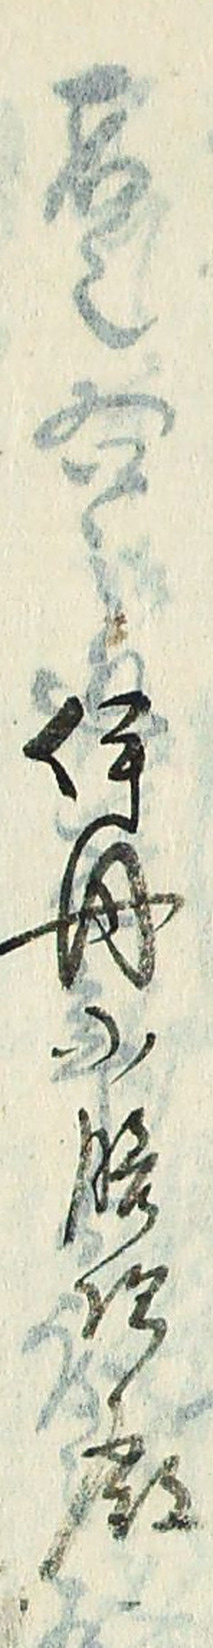伊丹小膳次殿
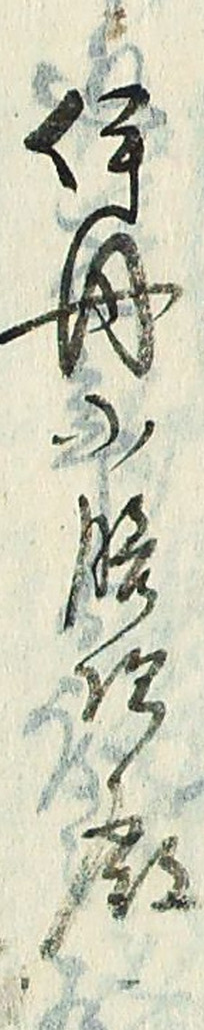伊丹小膳次殿
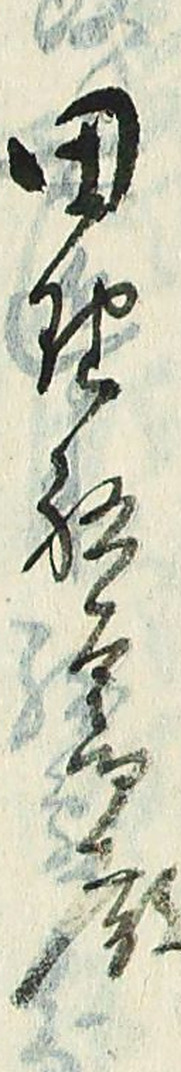田野祐太郎殿

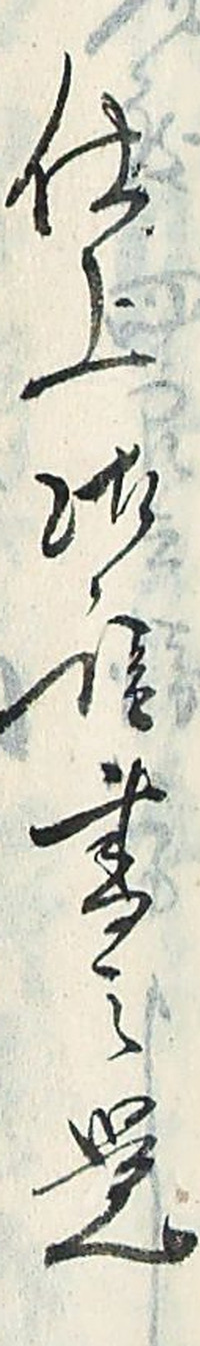仕上御請書之覚
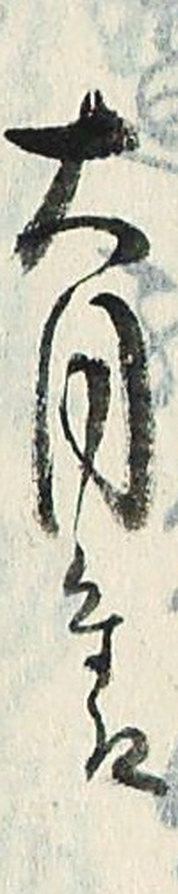大目付江
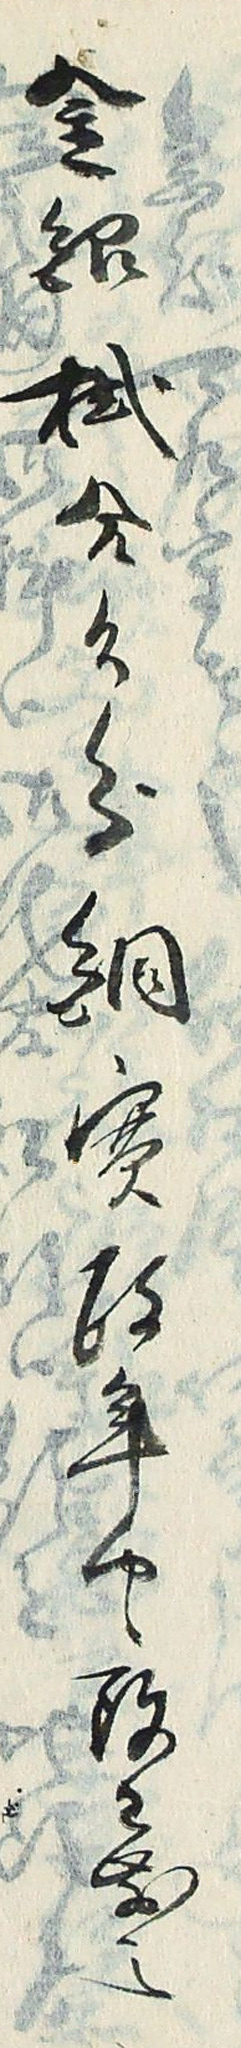金銀掛合候分銅寬政年中改已前之
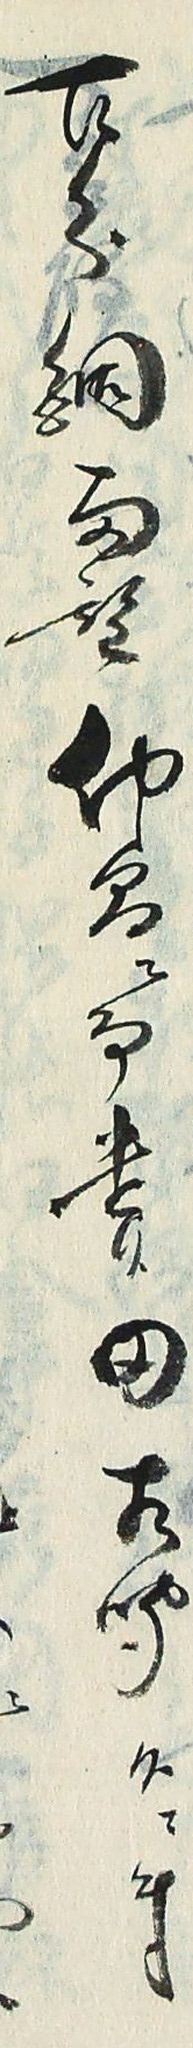古分銅両替仲間に而遣候由相聞候に付
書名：諸御用御□受書控
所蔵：鳴門教育大学 Naruto University of Education
